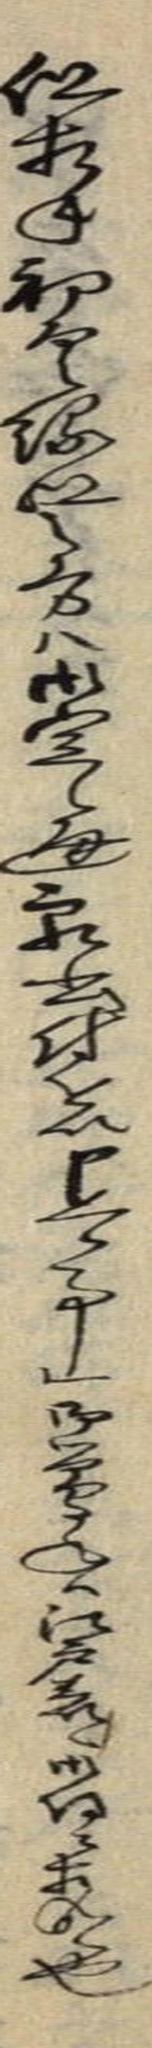但相手初而之縁組之方ハ御定之通願書付を以申上候事」御留守年ハ江戸表へ御伺ニ相成候也
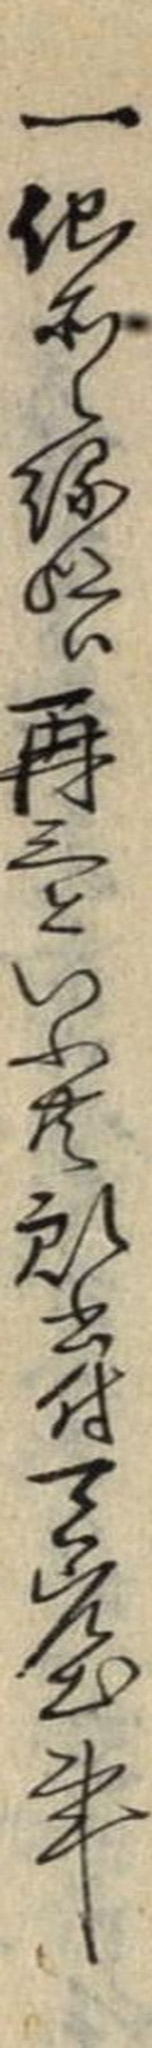一他所之縁組ハ再三といふ共願書付可差出事
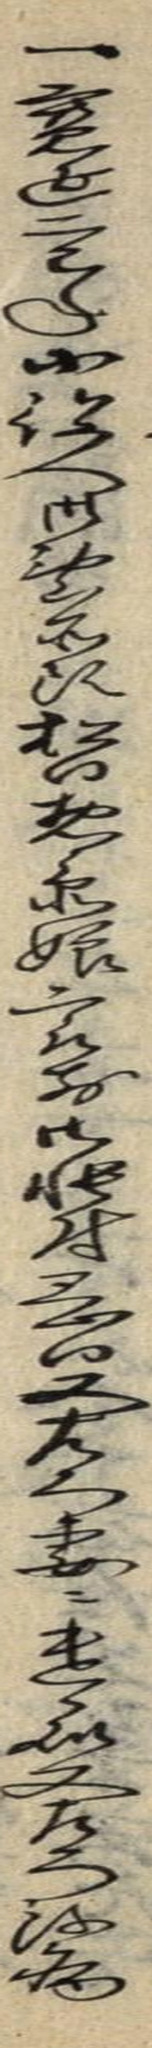一寛延二巳年小役人御台所頭松田惣兵衛娘最前御帳付岡田又左衛門妻ニ遣候処又左衛門致病
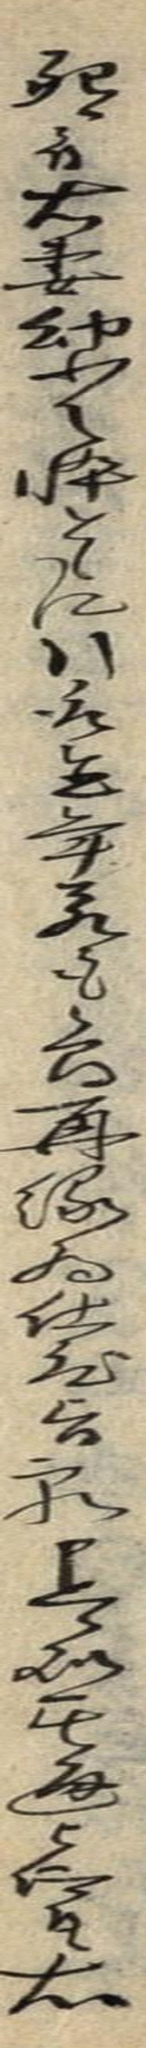死候ニ付右妻幼少之倅ともに引取置年若にも候間再縁為仕度旨願申上候処其通被仰付候右
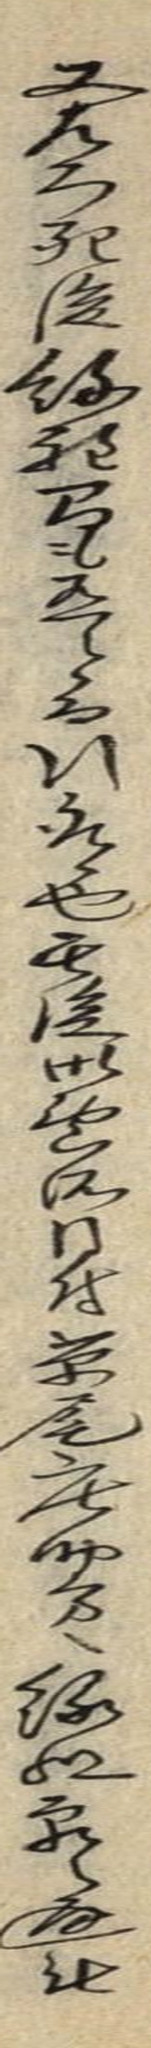又左衛門死後余程間も有之候而引取候也其後御台所目付草尾庄助方へ縁組願之通被
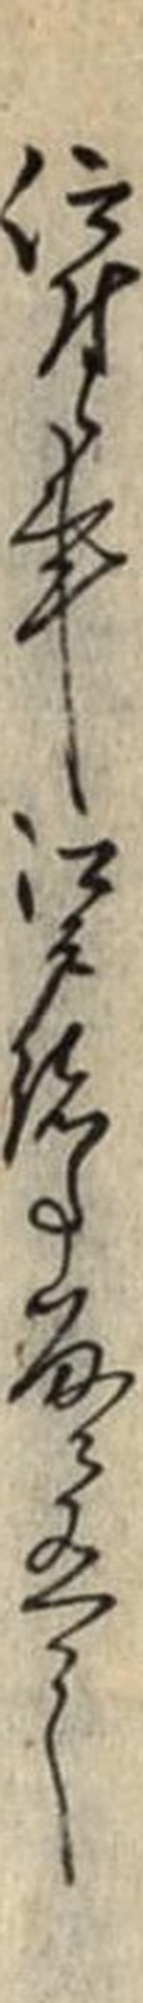仰付候事江戸諸事留ニ有之
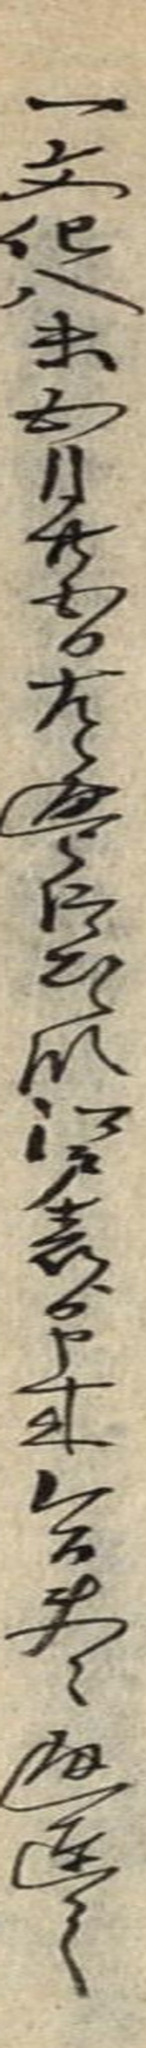一文化八未正月廿五日左之通被仰出候段江戸表ゟ申来今日夫々通達之
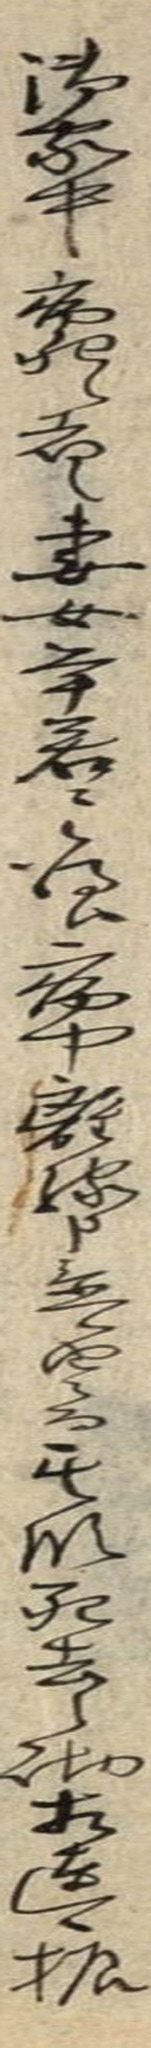御家中病死之者之妻女年若ニ候得ハ病中離縁申置候由ニ而其段死去之砌相達候振
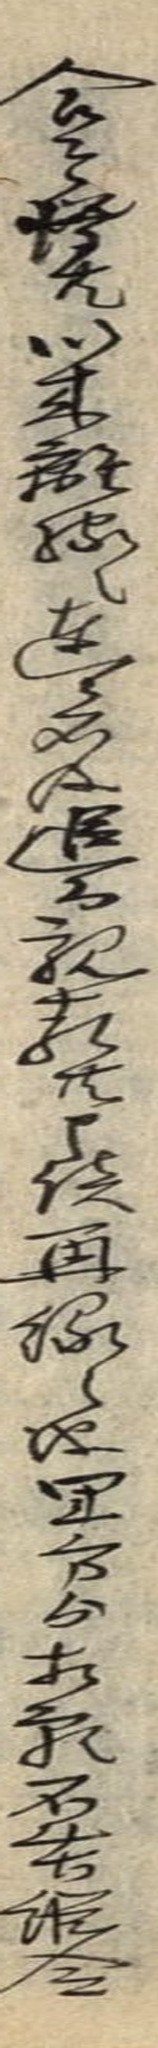合ニ候得共以来離縁候達ニ不及追而親類共申談再縁之儀里方ゟ相願不苦縦令
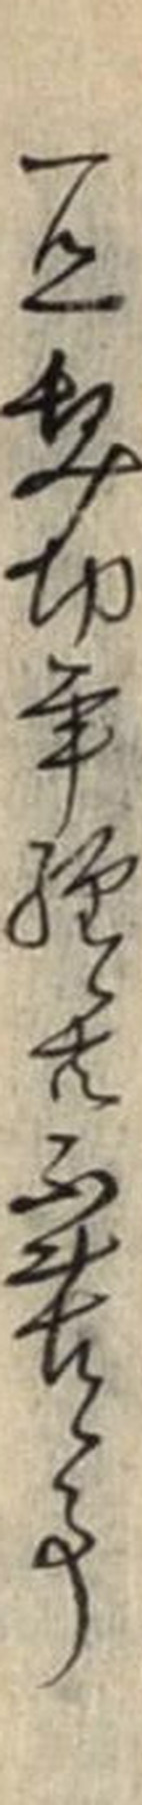一旦髪切年経候共不苦候事
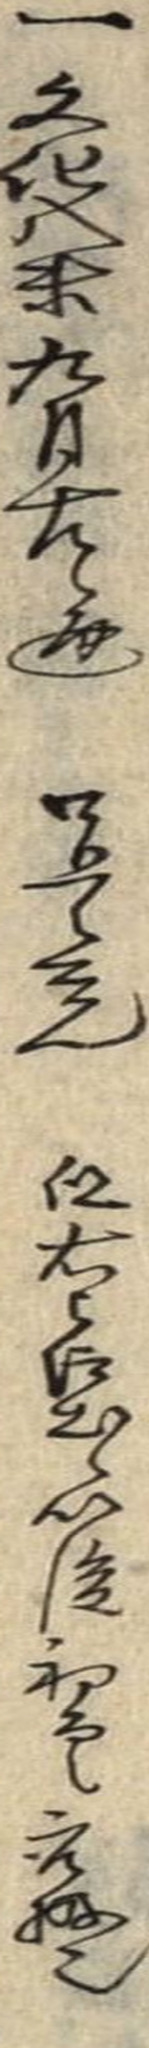一文化八未九月左之通口上之覚但右被仰出候以後初而之取扱也
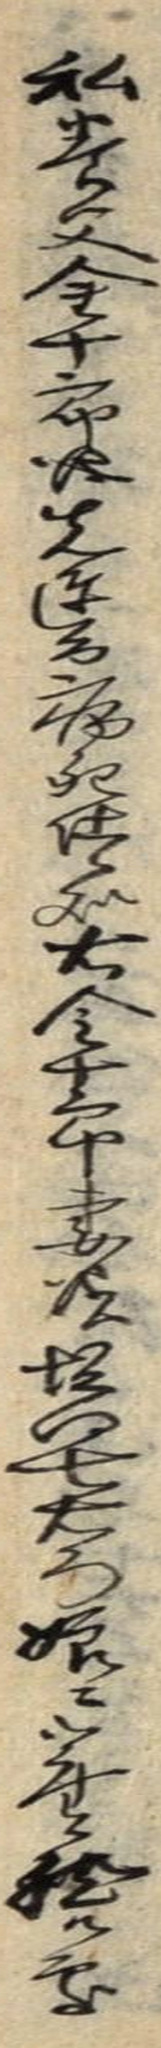私養父金十郎儀先達而病死仕候処右金十郎妻儀ハ坂田七右衛門娘ニ御座候然ル処

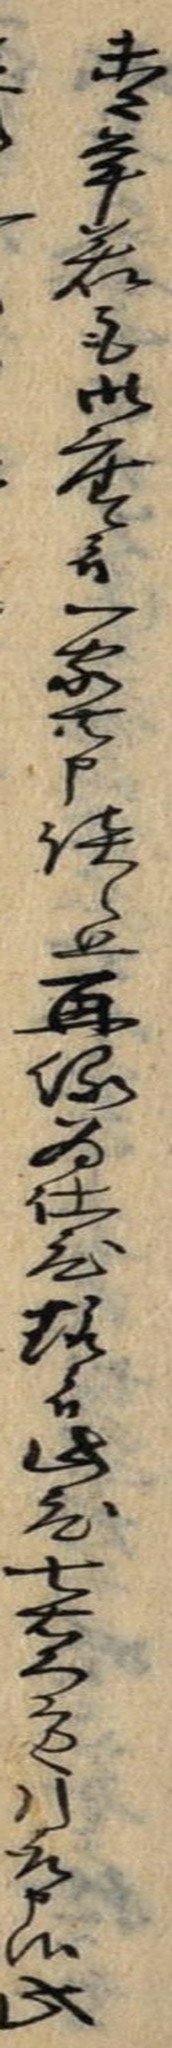未た年若ニも御座候ニ付一家共申談候上再縁為仕度趣ニ付此度七右衛門方へ引取申候此
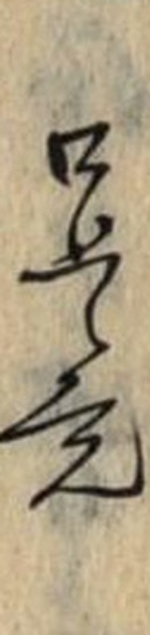口上之覚
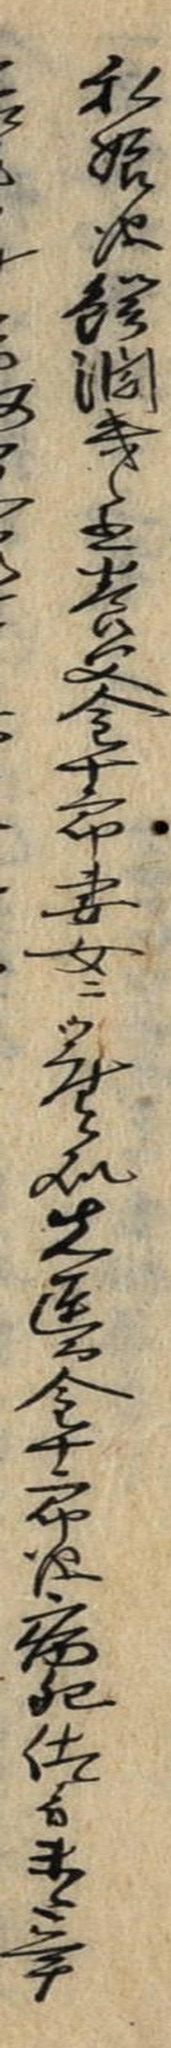私娘儀鰐淵幾之丞養父金十郎妻女ニ御座候処先達而金十郎儀病死仕候ニ付未た年
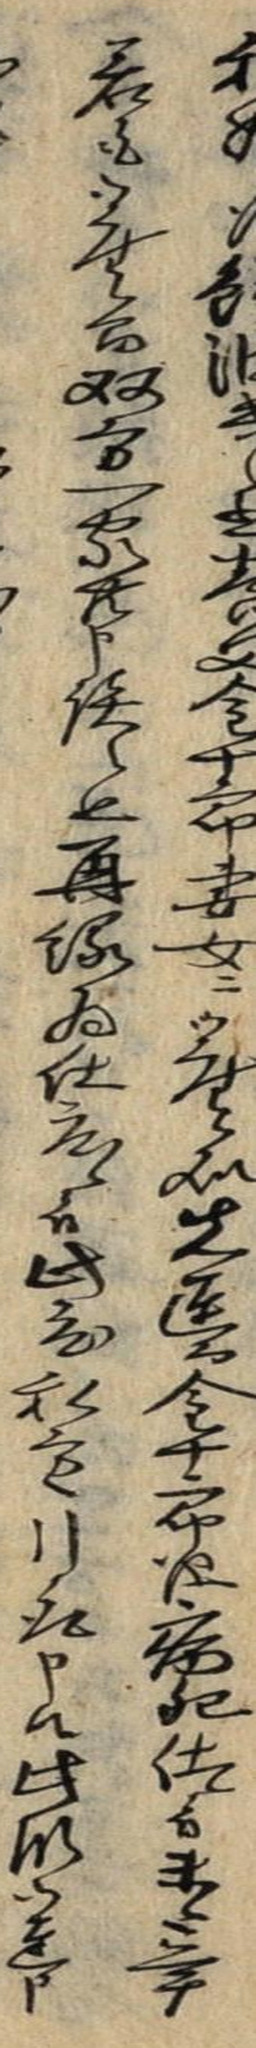若ニも御座候間双方一家共申談候上再縁為仕度候ニ付此度私方へ引取申候此段御達申
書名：養子縁組之部
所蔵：福井県文書館 Fukui Prefectural Archives
